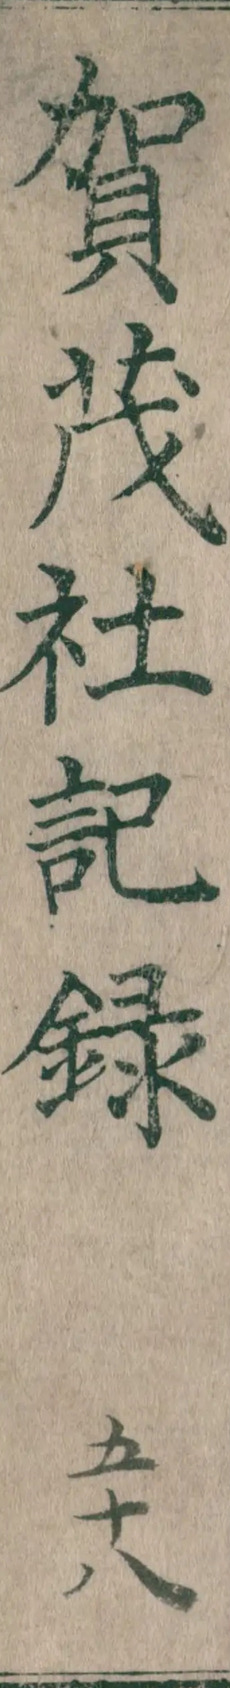賀茂社記録五十八

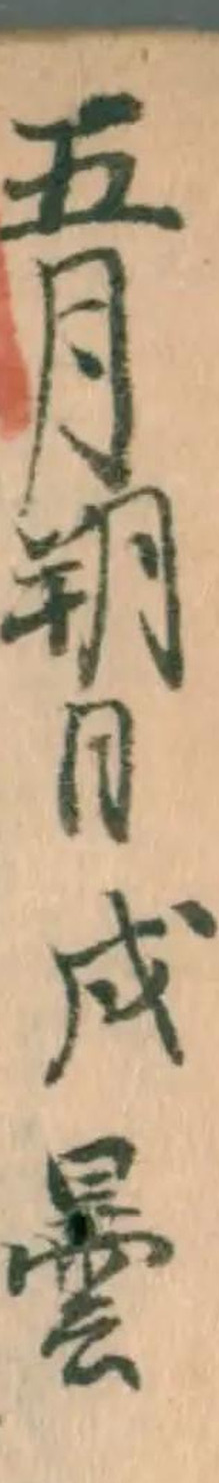五月朔日戌曇
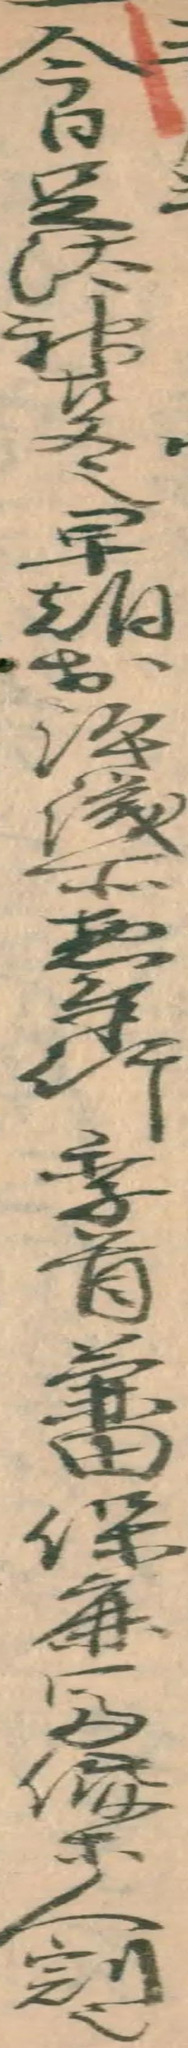一今日足汰神事也早朝於評議所惣奉行季首兼田保鹿冨俊等人割也
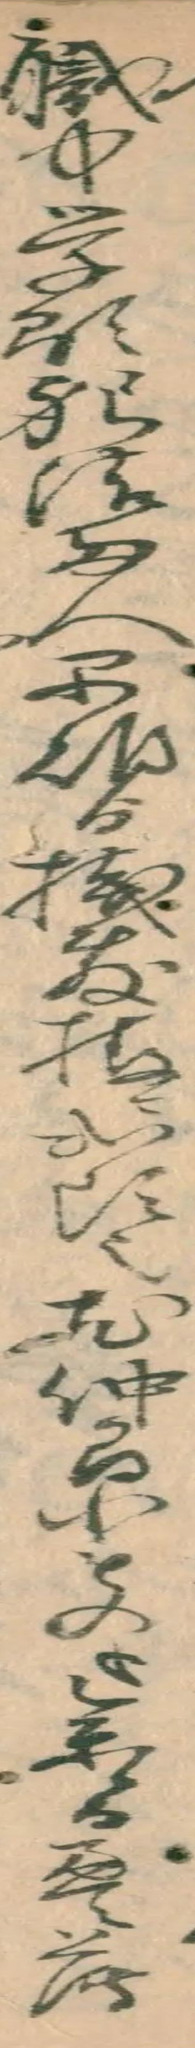職中学顕躬清両人早朝ゟ桟敷拵ニ出頭也尤仲間小ものも参候而畳薄
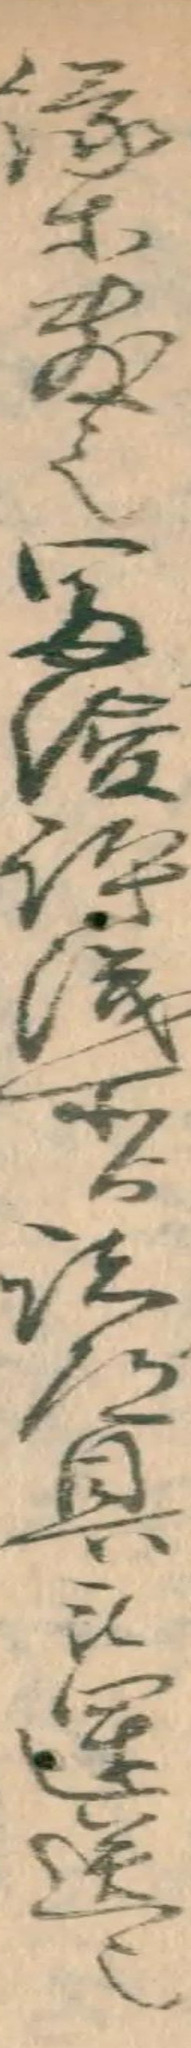縁等敷候也富俊評儀所ゟ諸道具被運送也
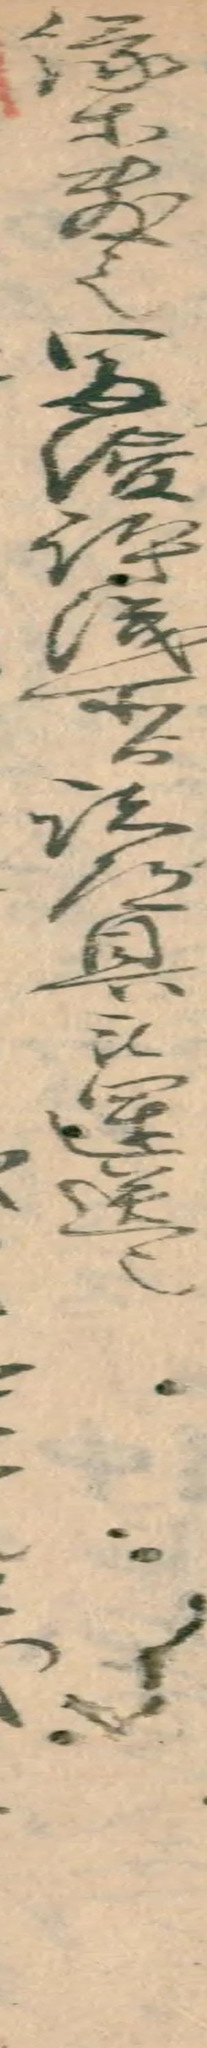縁等敷候也富俊評儀所ゟ諸道具被運送也
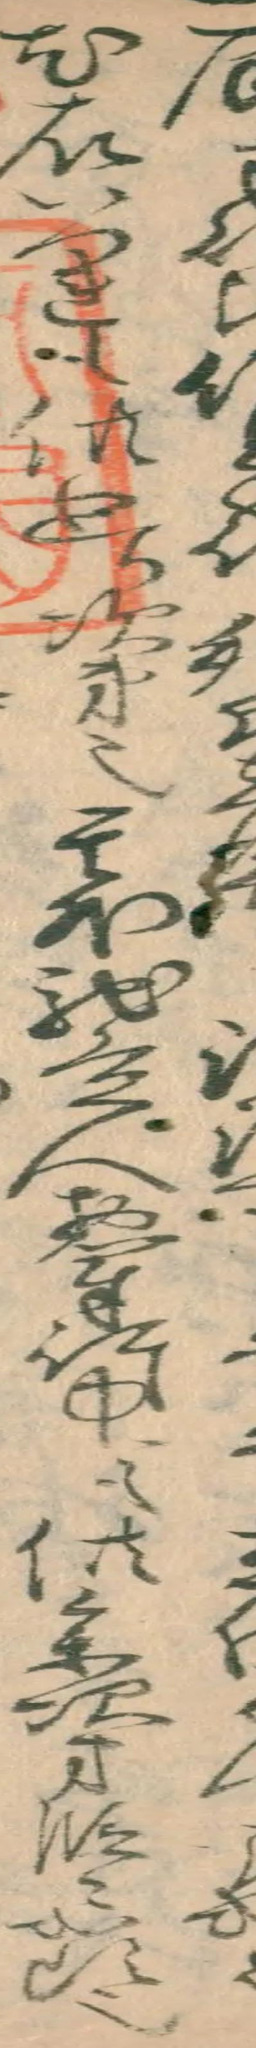尤右いつれも供廻り次第也其外馳走人惣奉行中も供参次第段々出頭也
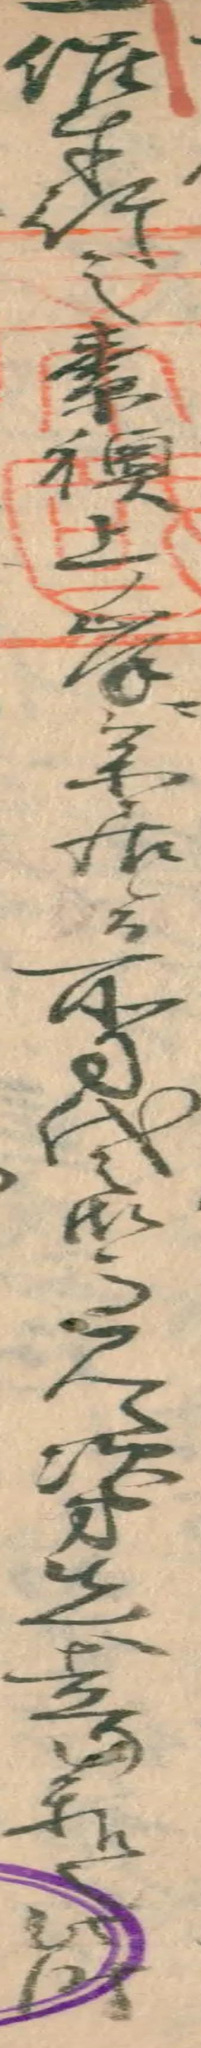一催奉行之素襖上ノ峯ニ参居候而所司代之御馬見へ次第先へ走り参ル也此時
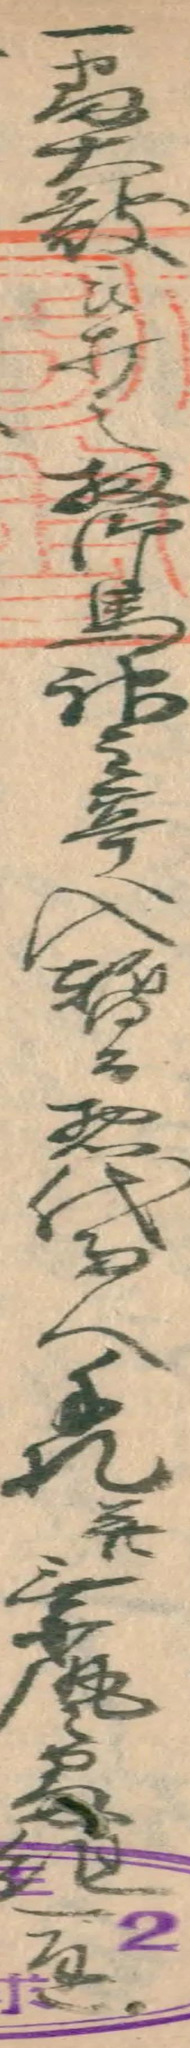一番大鼓被打也扨御馬神主亭へ入暫而惣代両人手札并乗尻之番組一通
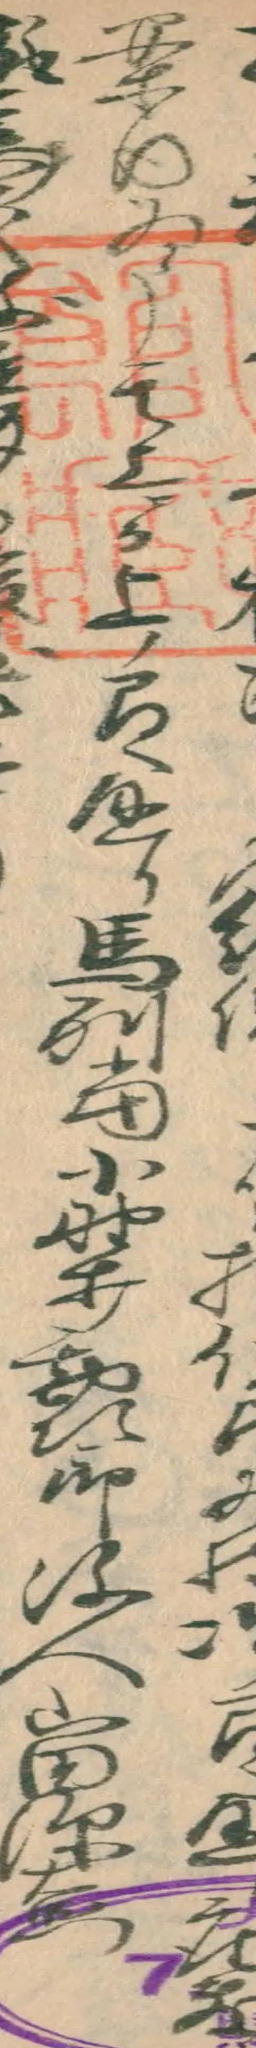案内為申候其上ニ而上ノ間へ通り馬別当小野打勘次郎役人山田源右衛門
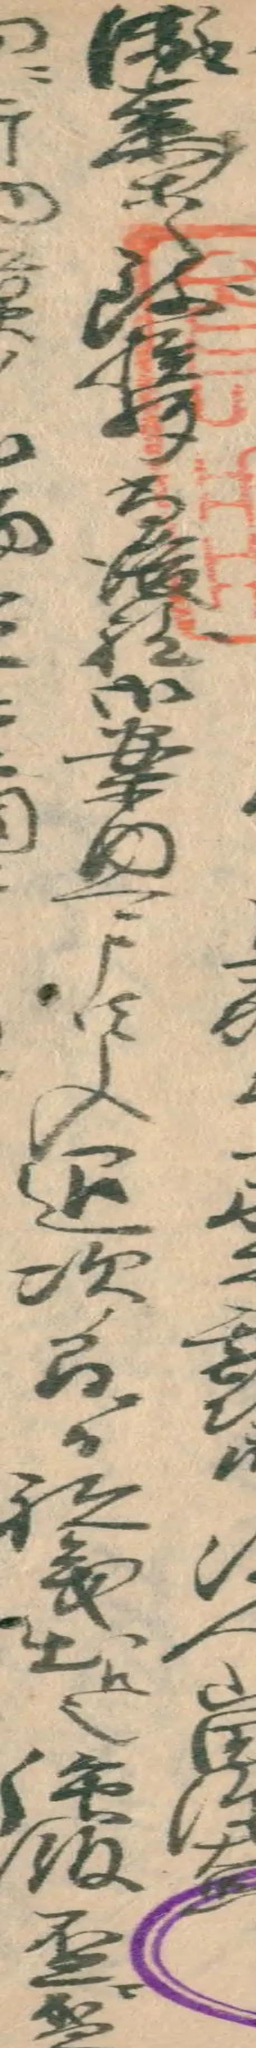等へ致挨拶尚後程御案内可申由申入退次ノ間ニ而祝義出ル也強飯盃ニ盛
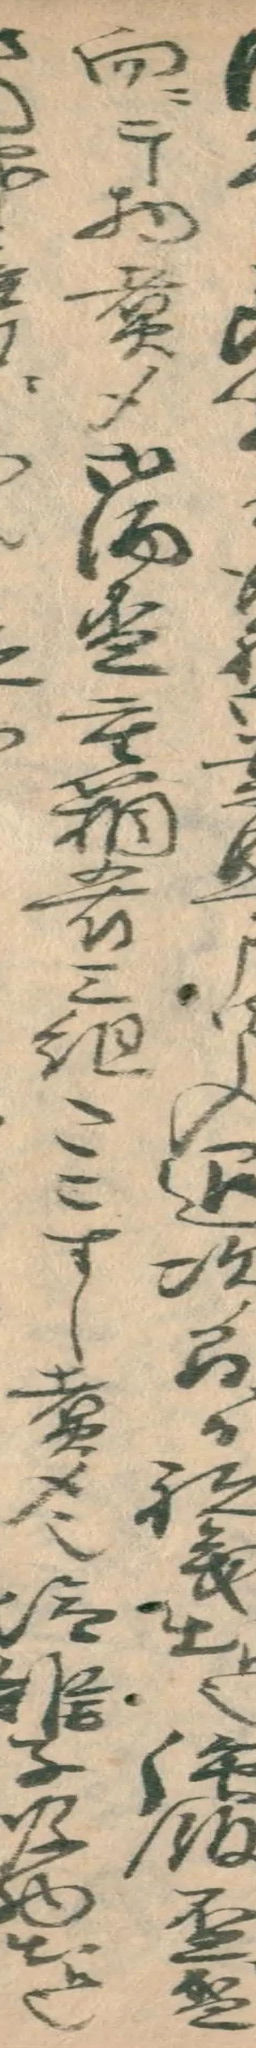向ニ干物煮〆御酒盃重箱肴三組たこすし煮〆也塩雉子吸物出ル也
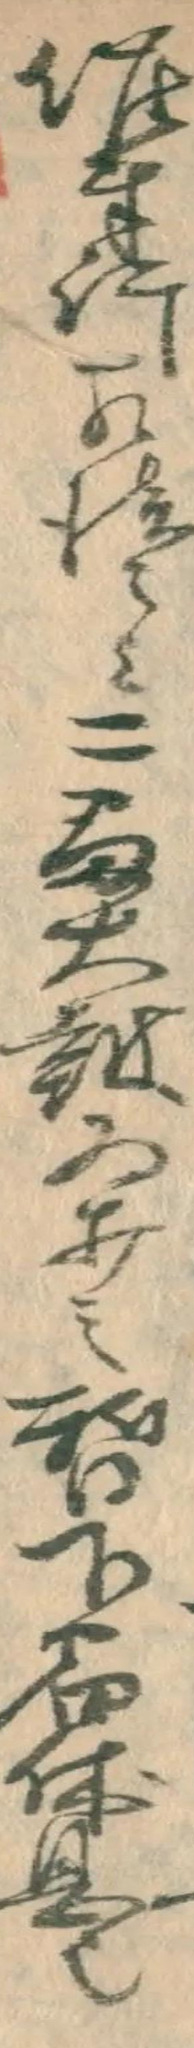催奉行相談之上二番大鼓為打之暫下宿休息也
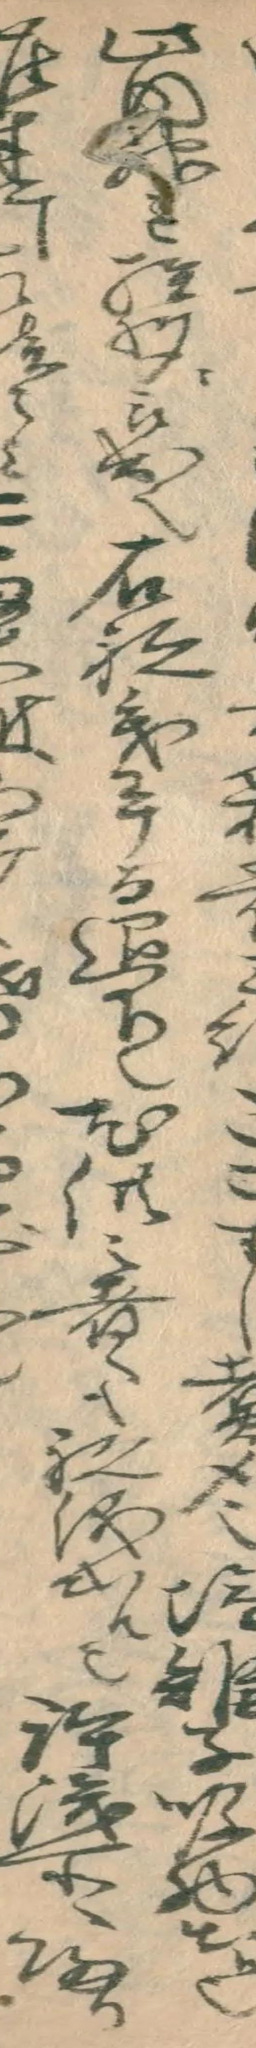此内神主挨拶ニ被出也右祝義畢而退下也尤供之者へも祝儀出ル也評議所へ帰り
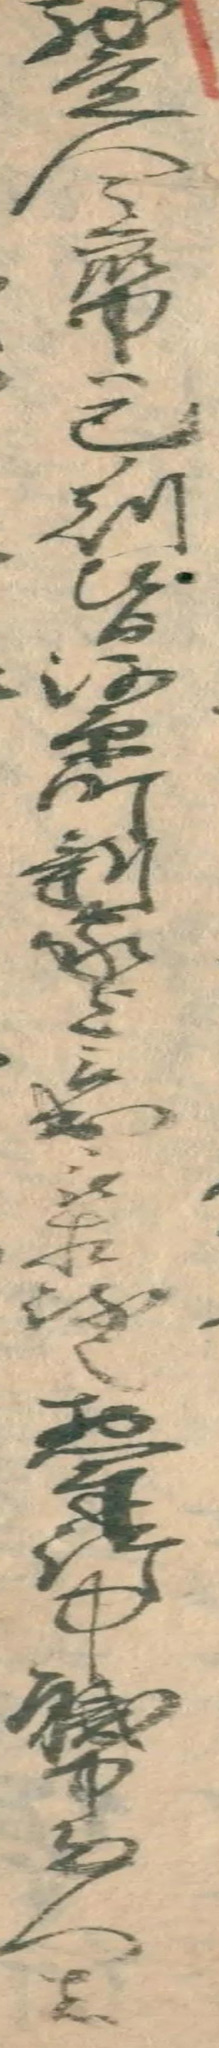一馳走人之衆中ハ巳ノ刻比ゟ河原町新家迄被出被相待也惣奉行中職中両人者
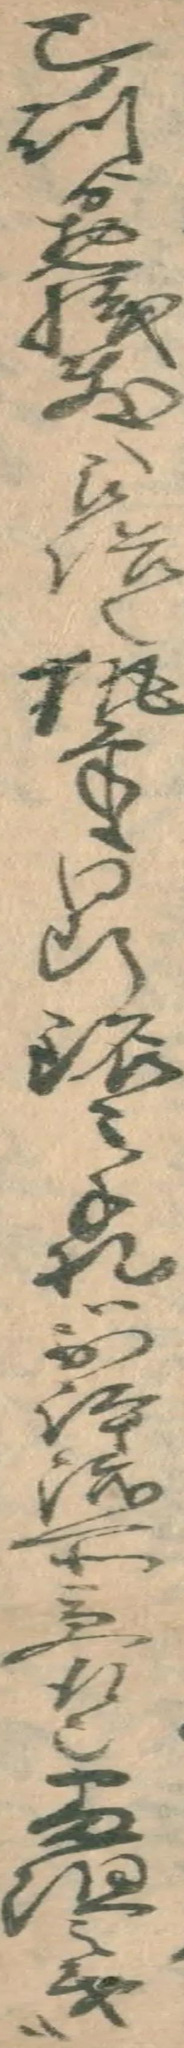巳ノ刻ゟ惣桟敷へ被詰也執筆も同断銘々手札ハ於評議所受取也番組之義も
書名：賀茂社記録. 第58冊
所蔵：国立国会図書館 National Diet Library, JAPAN
